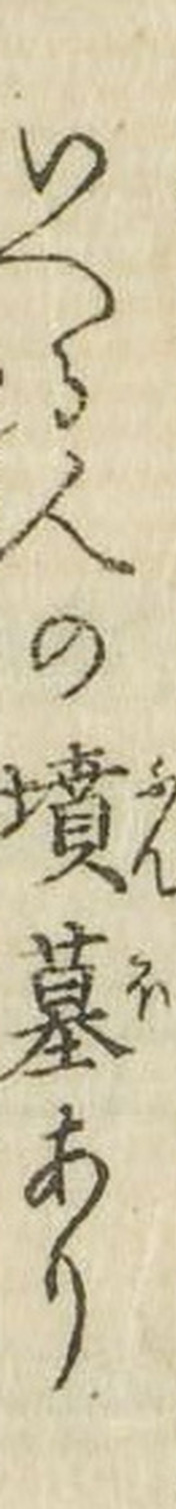いへる人の墳墓あり
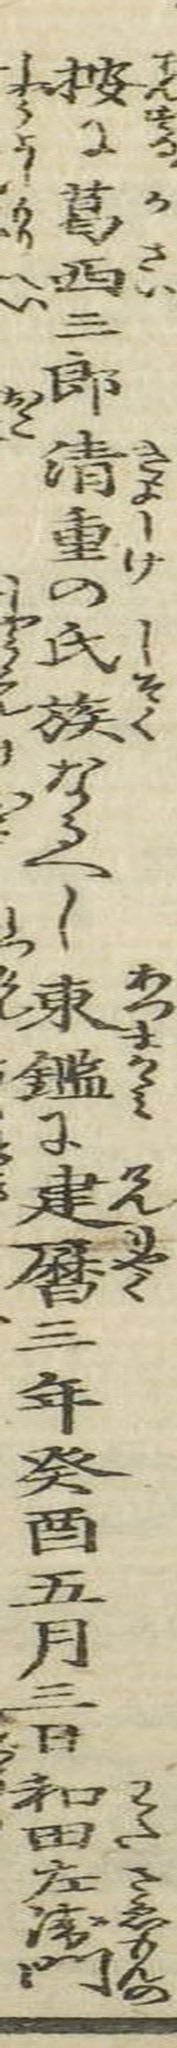按に葛西三郎清重の氏族なるへし東鑑に建暦三年癸酉五月三日和田左衛門
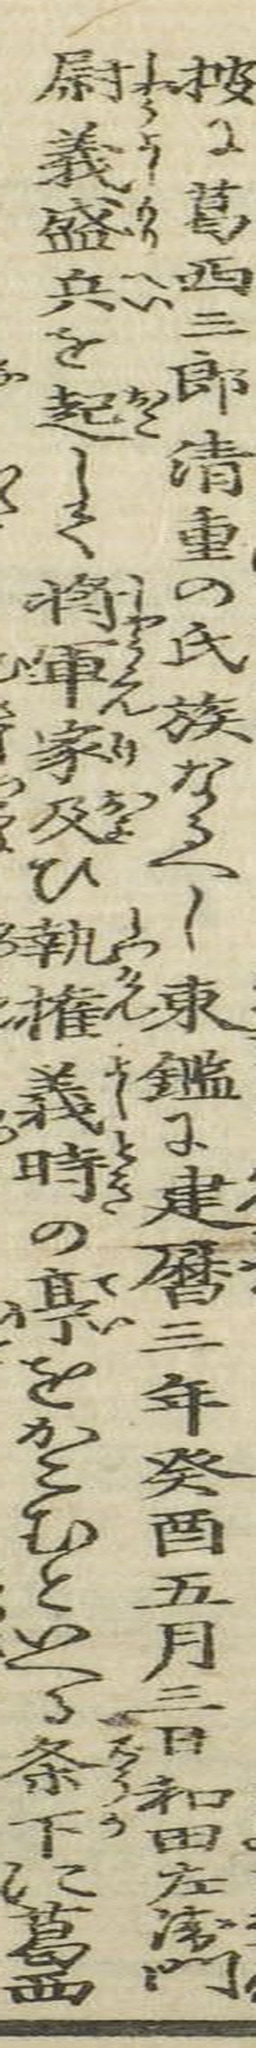尉義盛兵を起して将軍家及ひ執権義時の亭をかこむといへる条下に葛西
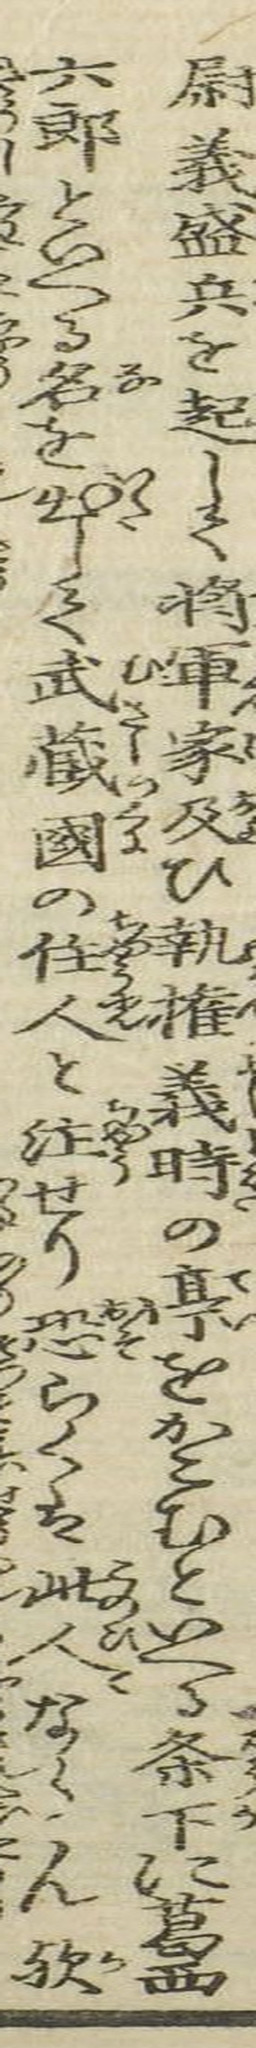六郎といへる名を出して武蔵国の住人と注せり恐らくは此人ならん歟
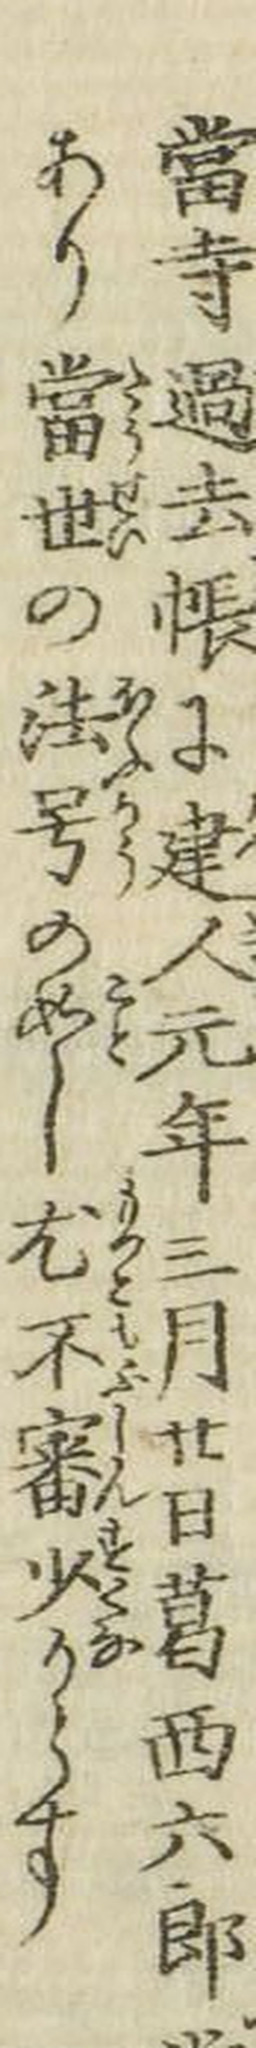あり当世の法号の如し尤不審少からす
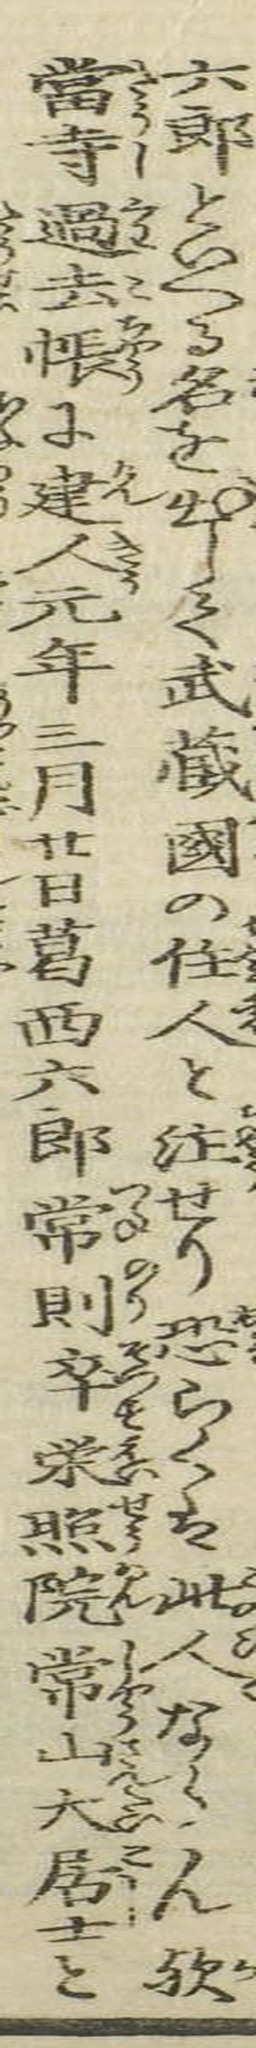当寺過去帳に建人元年三月廿日葛西六郎常則卒栄照院常山大居士と
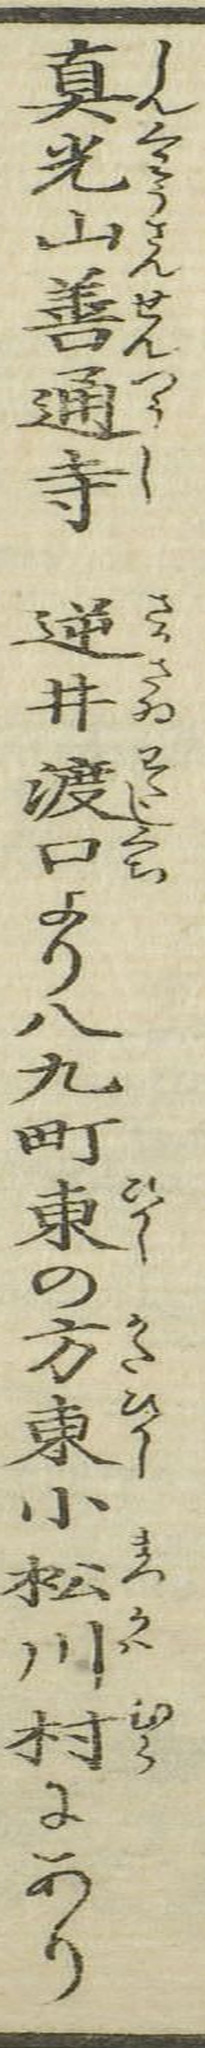真光山善通寺逆井渡口より八九町東小松川村にあり
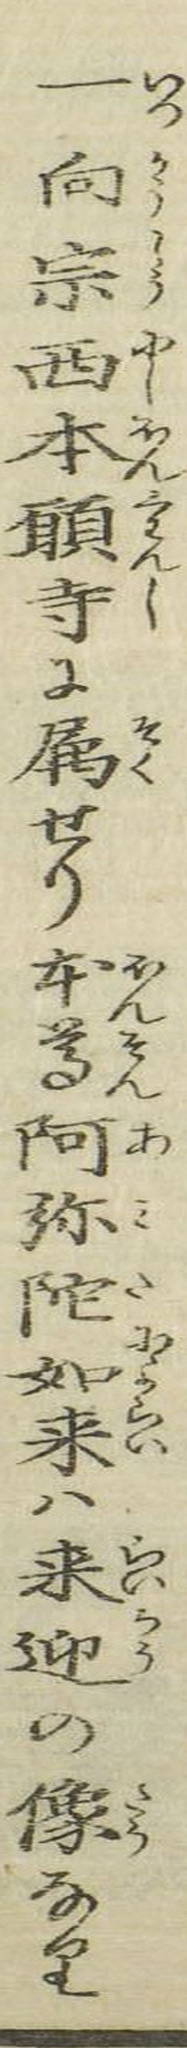一向宗西本願寺に属せり本尊阿弥陀如来は来迎の像なり
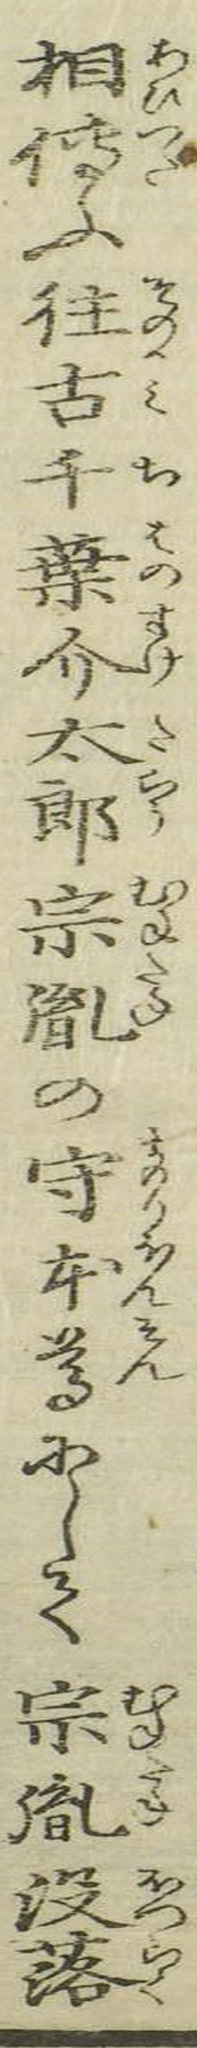相伝ふ徃古千葉介太郎宗胤の守本尊にして宗胤没落
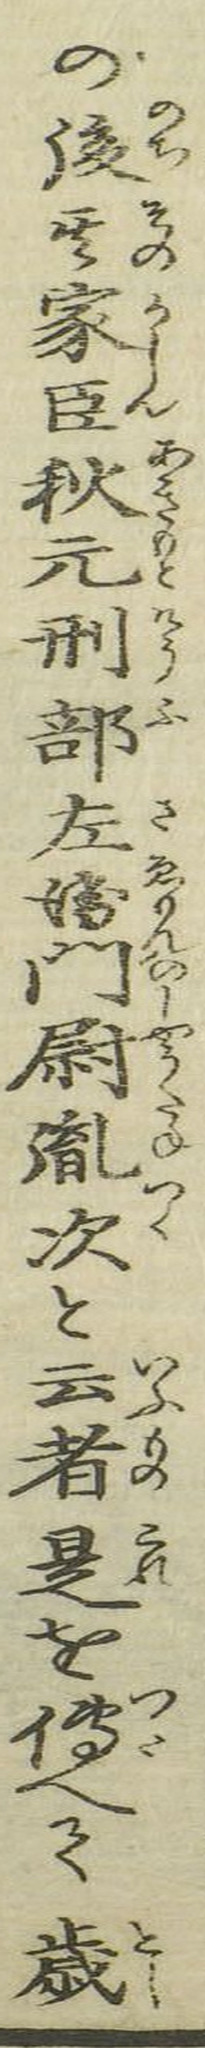の後其家臣秋元刑部左衛門尉胤次と云者是を伝へて歳

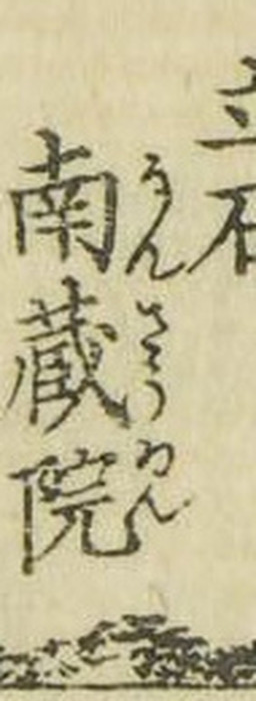南蔵院
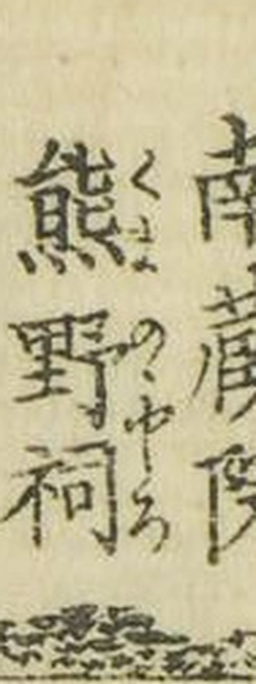熊野祠

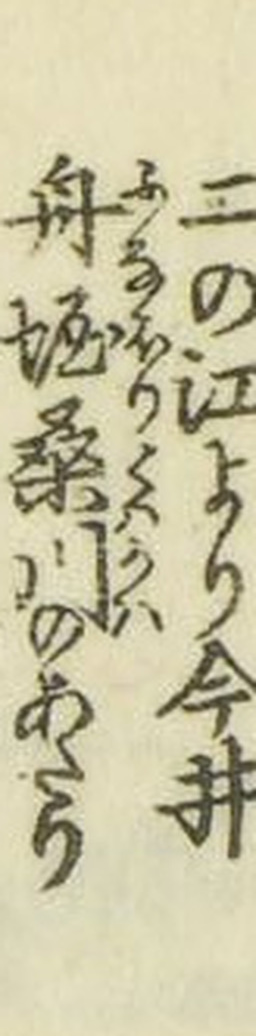船堀桑川のあたり
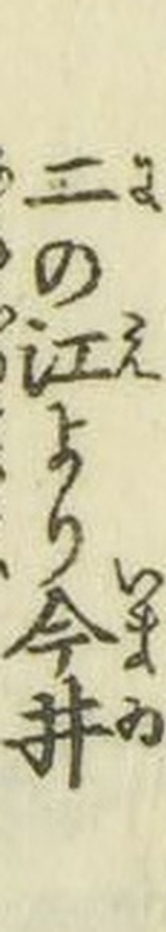二の江より今井
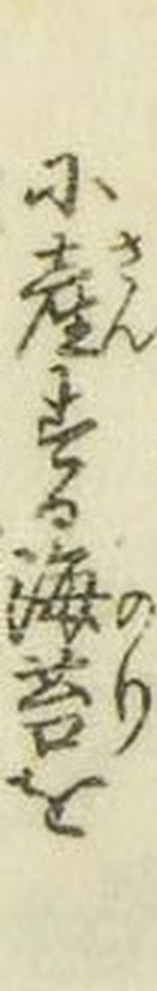に産する海苔を
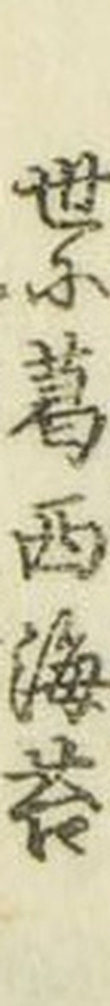世に葛西海苔
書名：江戸名所図会 20巻 巻之19
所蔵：東京学芸大学教育コンテンツアーカイブ
